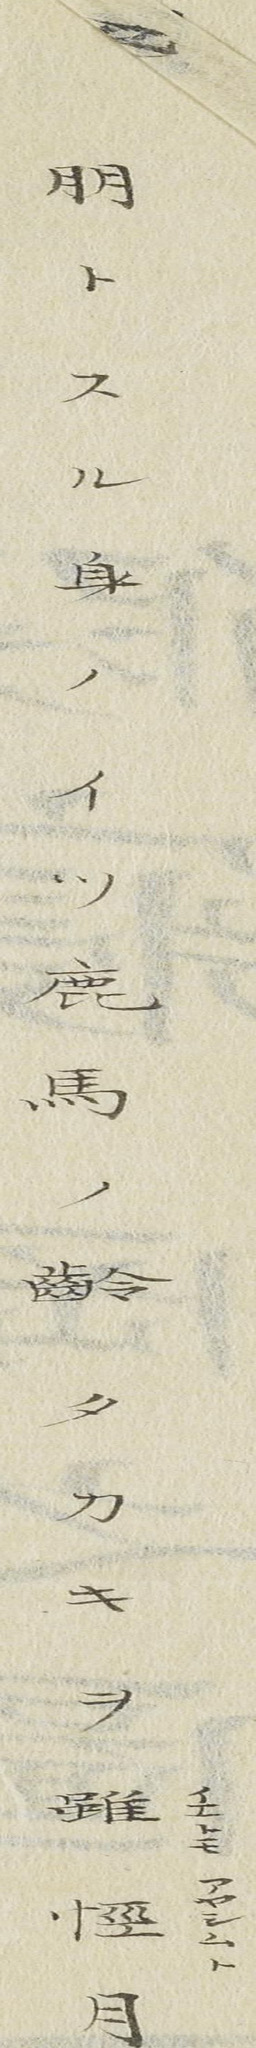朋トスル身ノイツ鹿馬ノ齢タカキヲ雖怪月
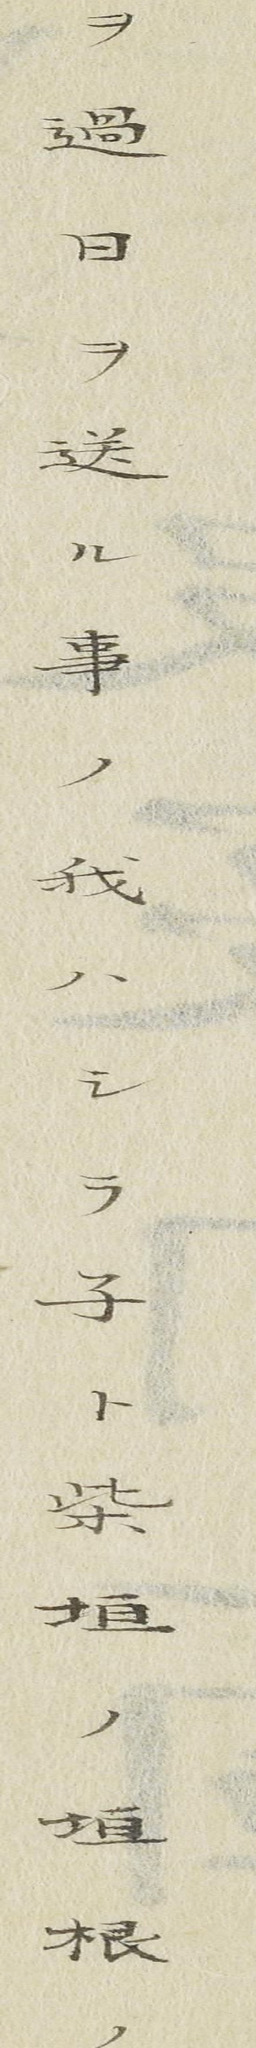ヲ過日ヲ送ル事ノ我ハシラ子ト柴垣ノ垣根ノ
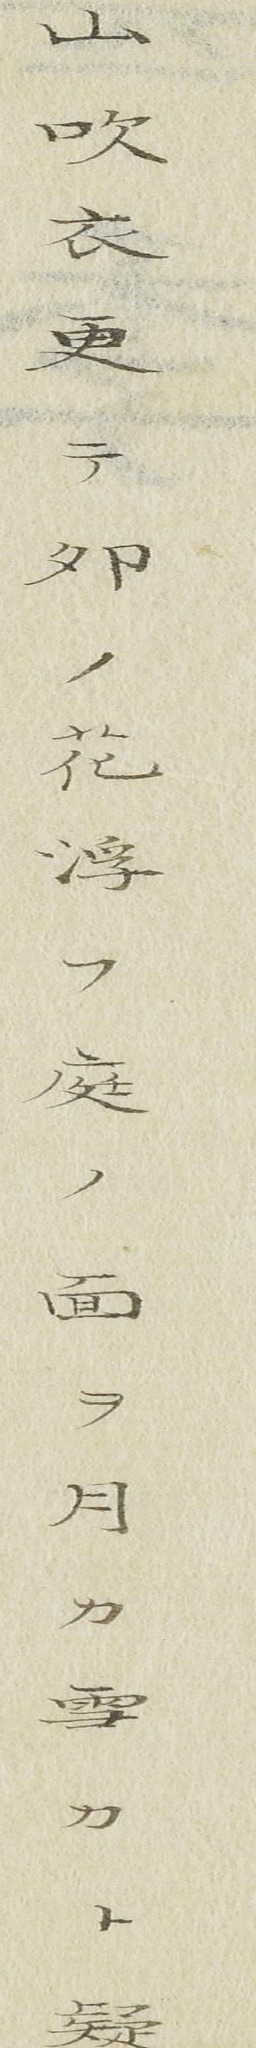山吹衣更テ夘ノ花浮フ庭ノ面ヲ月カ雪カト疑
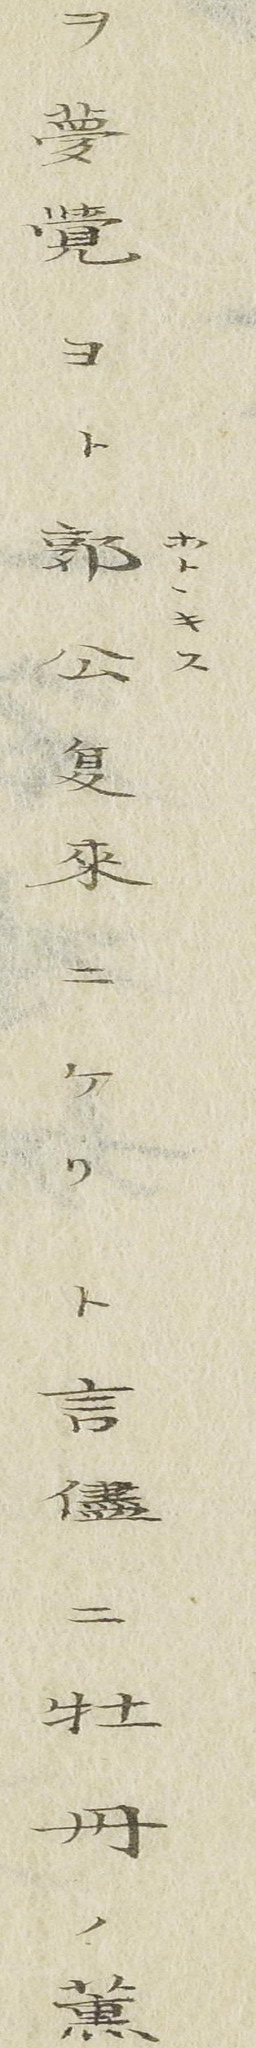ヲ夢覚ヨト郭公夏来ニケリト言侭ニ牡丹ノ薫
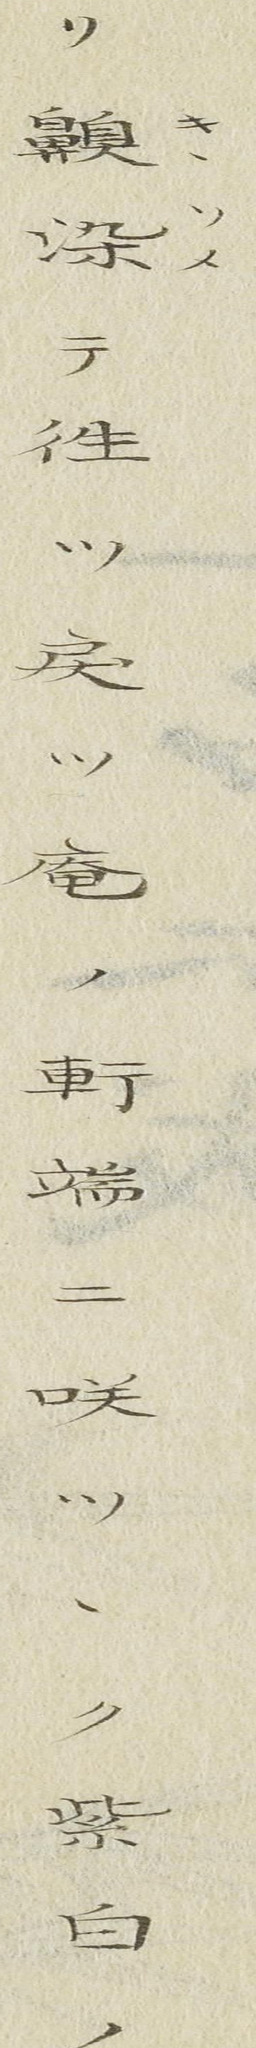リ齅染テ往ツ戻ツ庵ノ軒端ニ咲ツヽク紫白ノ
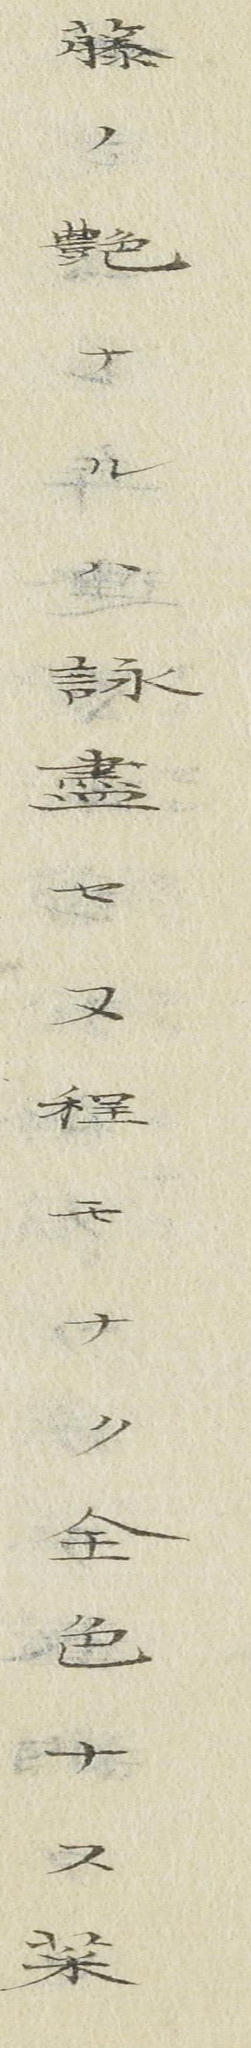藤ノ艶ナルハ詠尽セヌ程モナク全色ナス菜ノ
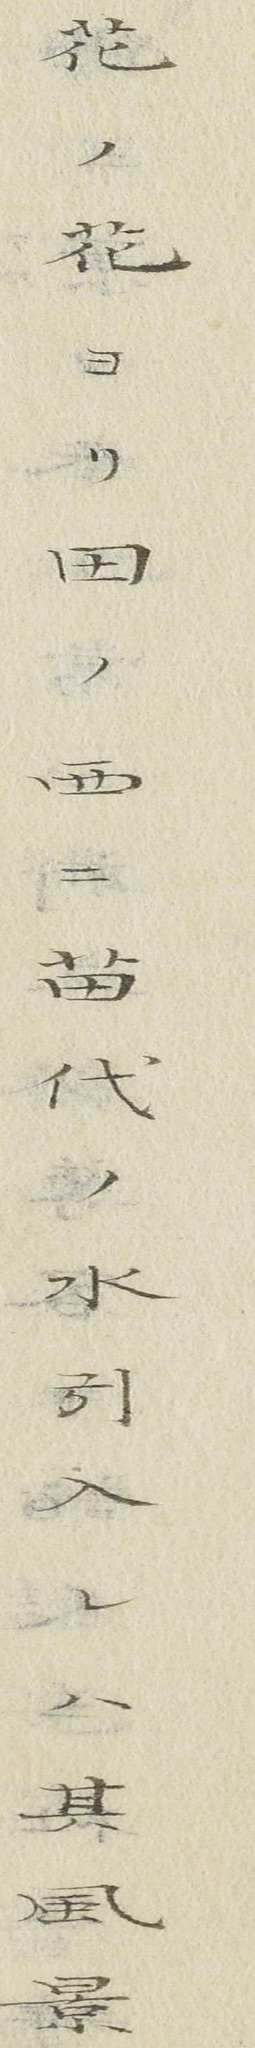花ノ花ヨリ田ノ西ニ苗代ノ水引入レハ其風景
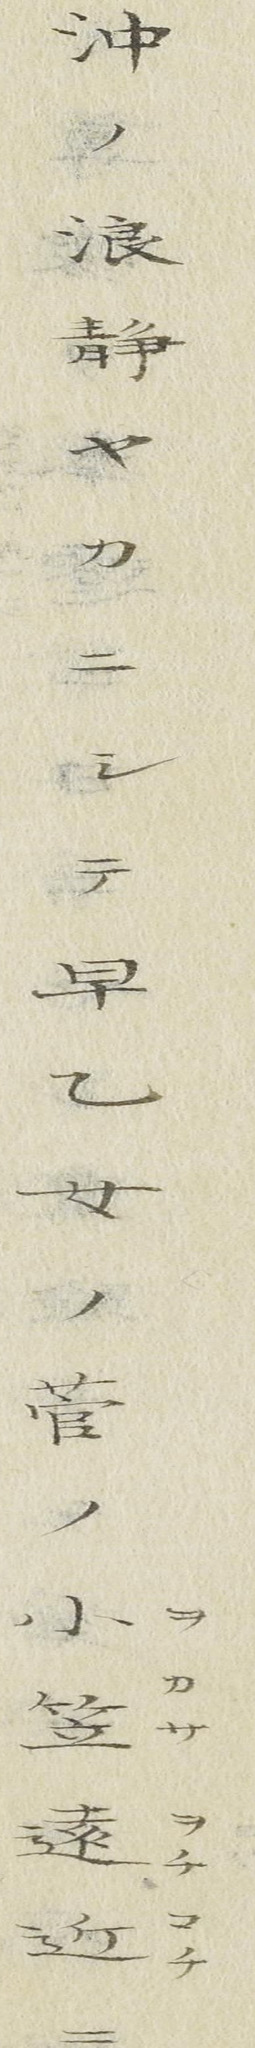沖ノ浪静ヤカニシテ早乙女ノ菅ノ小笠遠近ニ
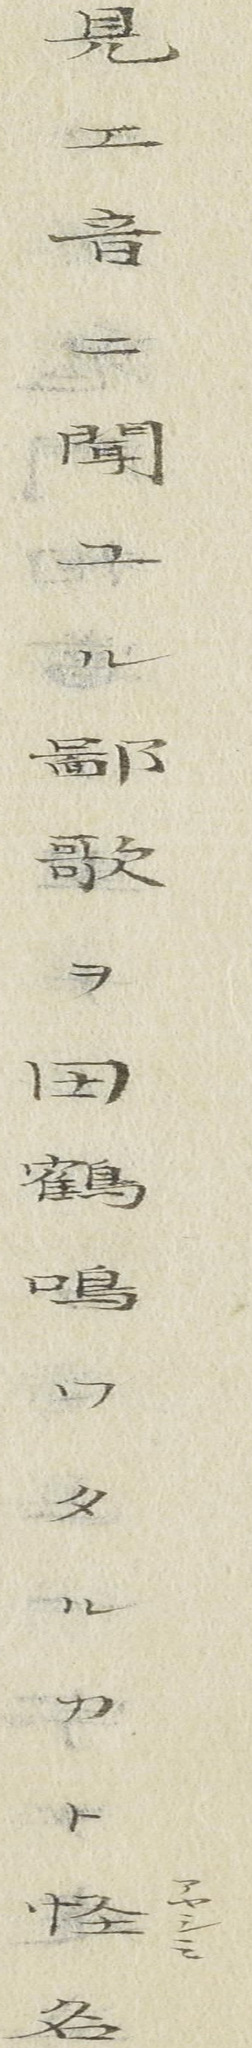見エ音ニ聞ユル鄙歌ヲ田鶴鳴ワタルカト怪名
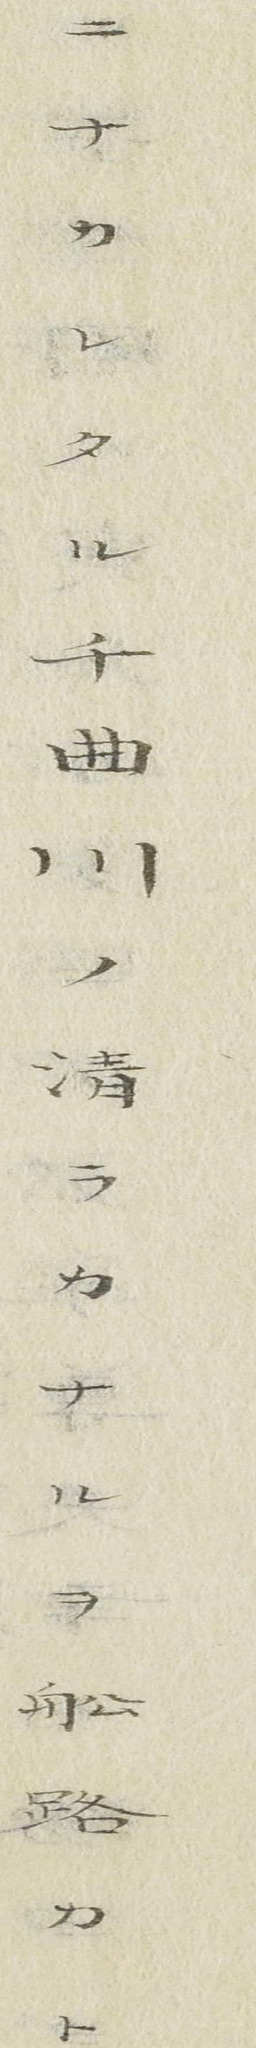ニナカレタル千曲川ノ清ラカナルヲ船路カト
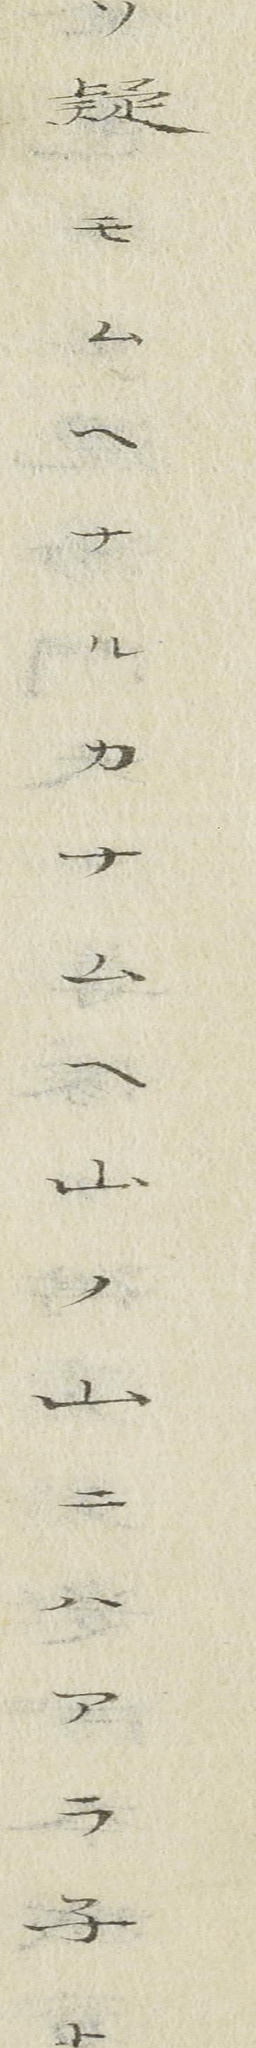ソ疑モムヘナルカナムヘ山ノ山ニハアラ子ト
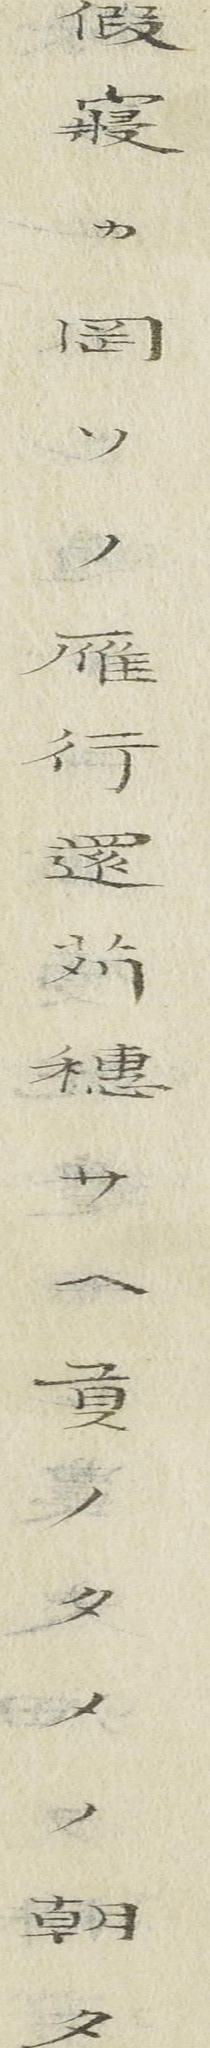仮寝カ岡ソノ雁行還苅穂サヘ夏ノタメノ朝夕
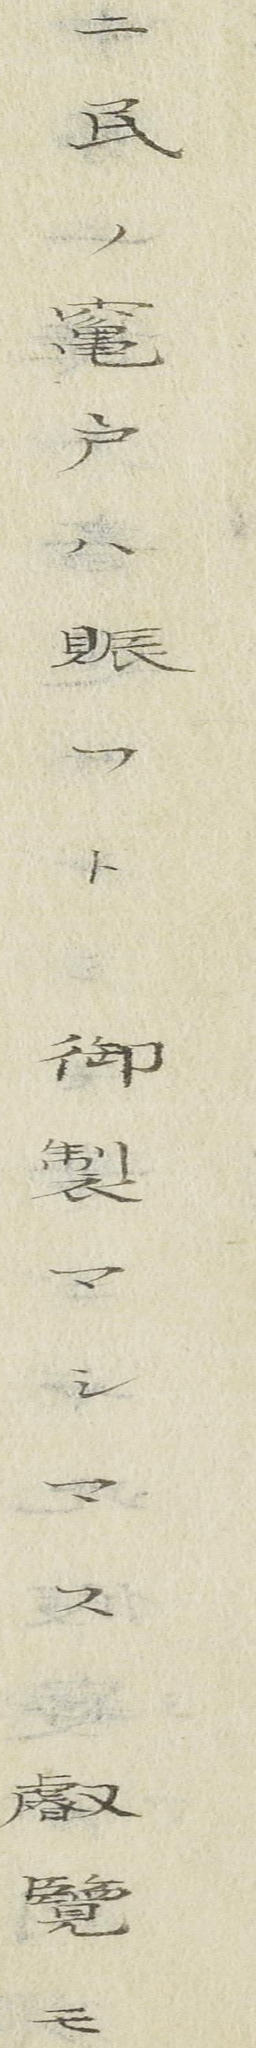ニ民ノ竃戸ハ賑フト御製マシマス叡覧モ
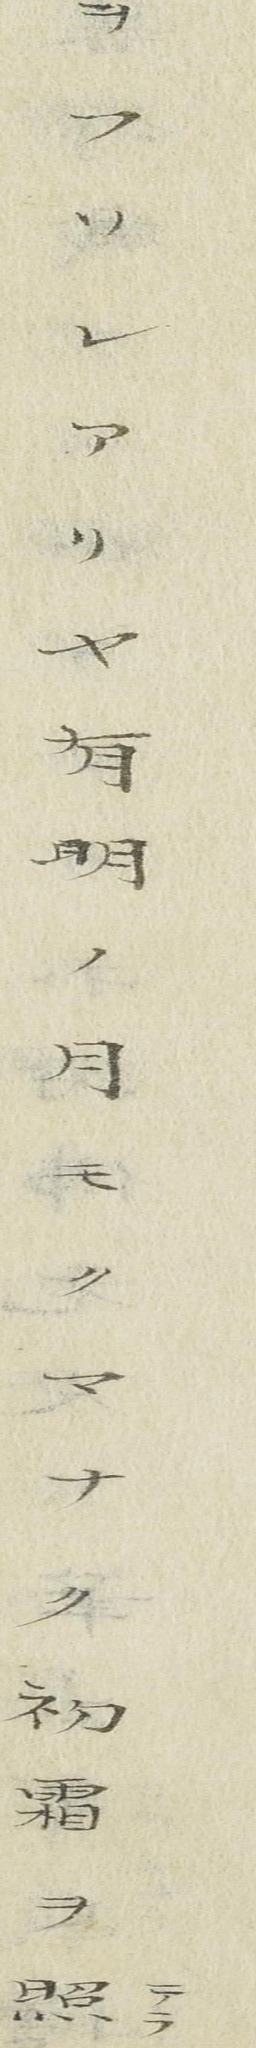ヲフソレアリヤ有明ノ月モクマナク初霜ヲ照
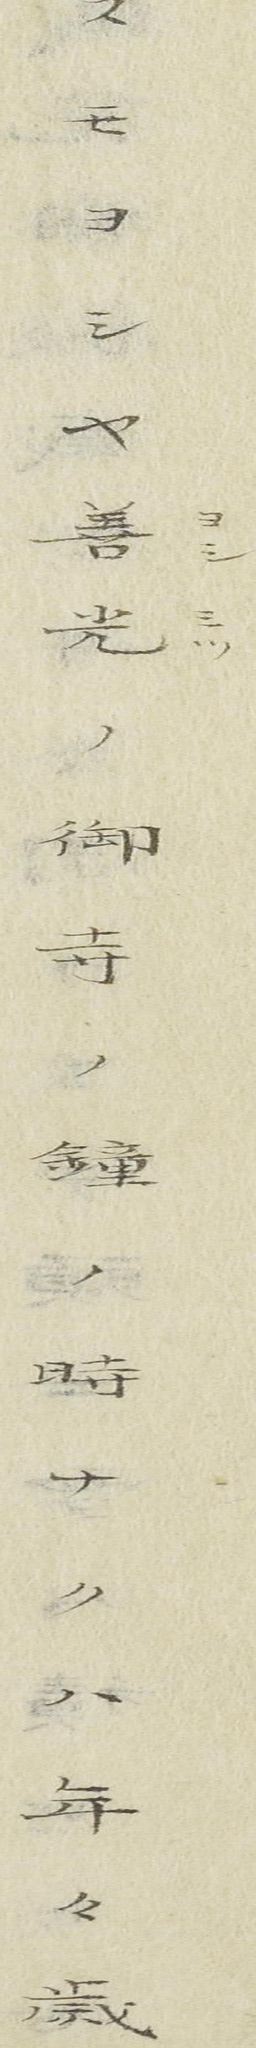スモヨシヤ善光ノ御寺ノ鐘ノ時ナクハ年々歳

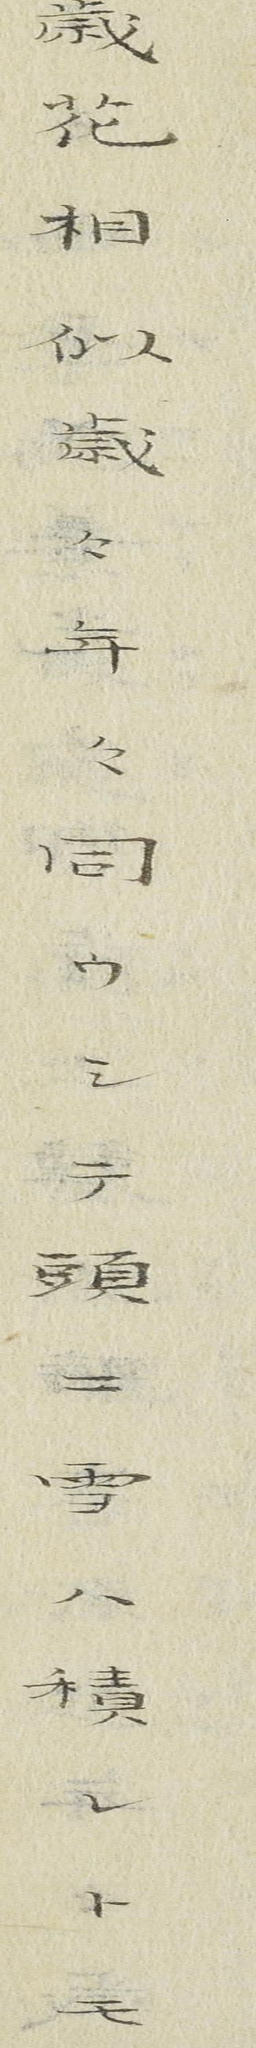歳花相似歳々年々同ウシテ頭ニ雪ハ積レトモ
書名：地災撮要　地震之部　巻ノ二
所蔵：東京大学地震研究所図書室 Earthquake Research Institute Library, The University of Tokyo, JAPAN
